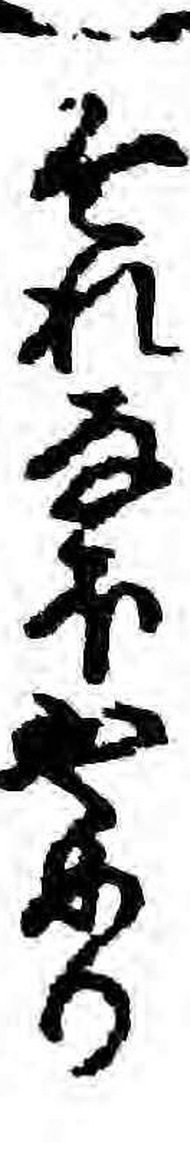それなほやめり
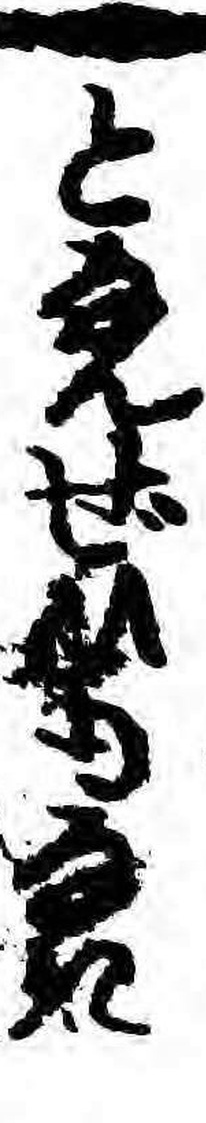となんぜひもなき
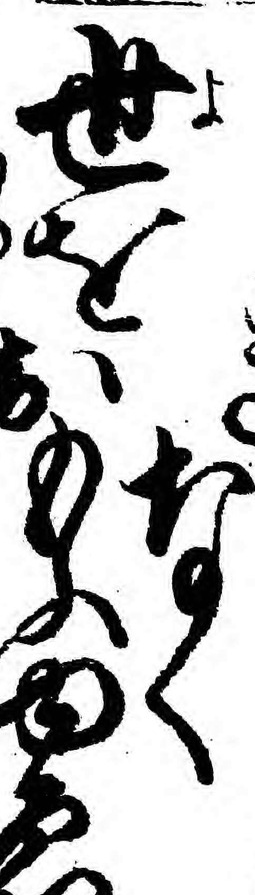世をおもふゆゑに
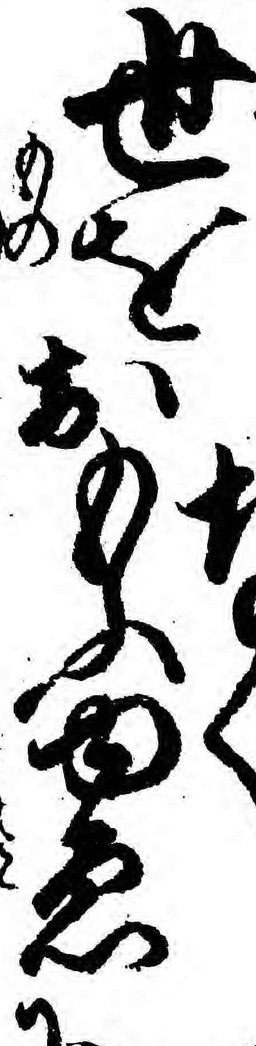世をおもふゆゑに
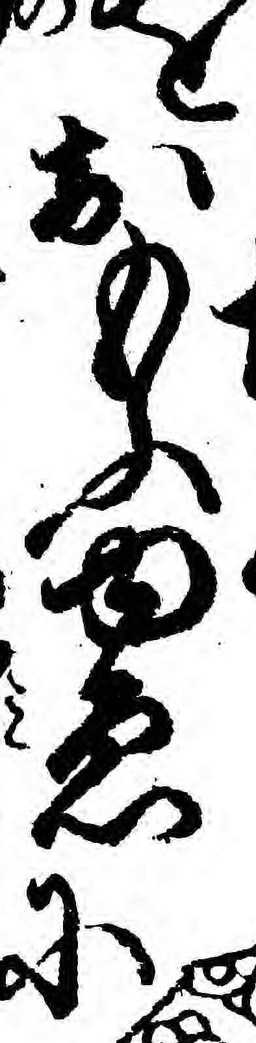世をおもふゆゑに
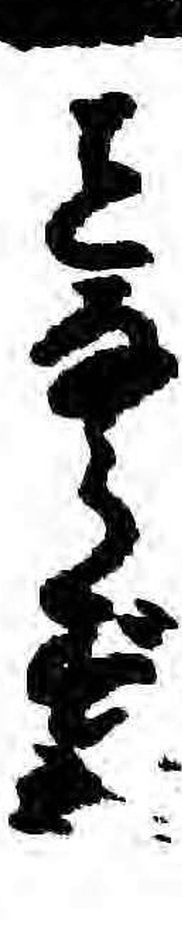ことならず
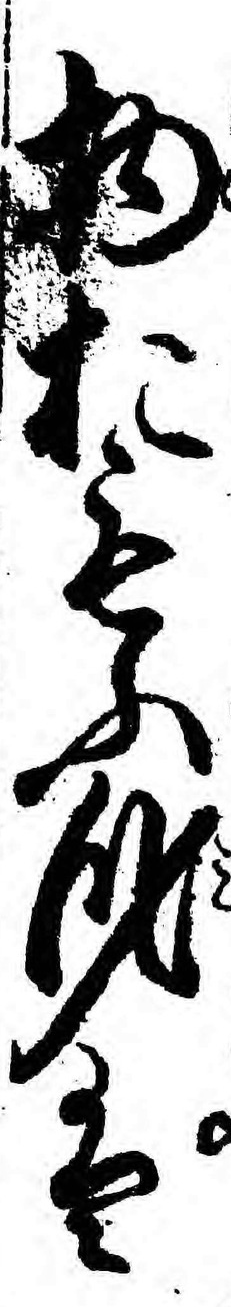物おもふ身は

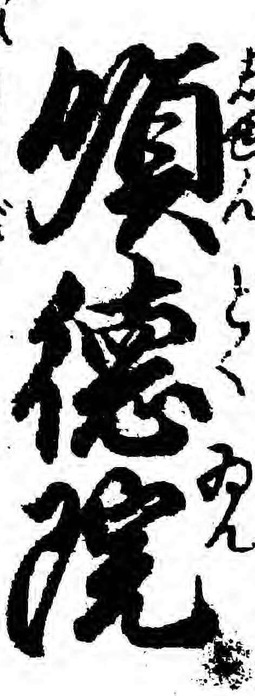順徳院
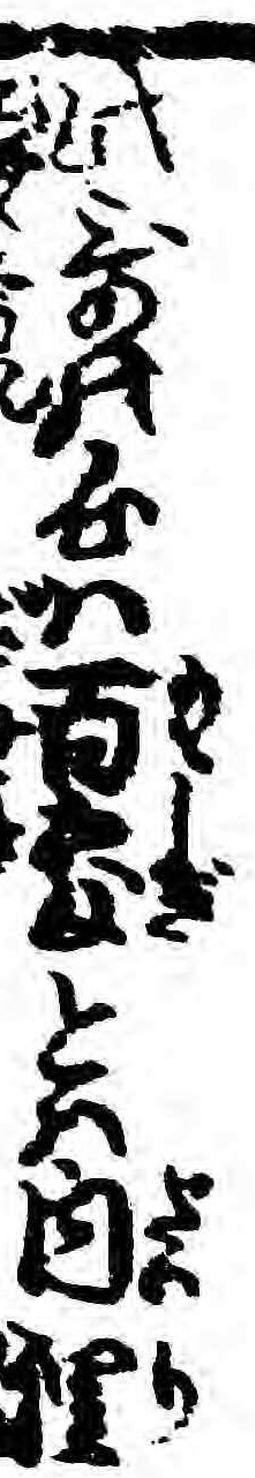此哥の心は百敷とは内裡
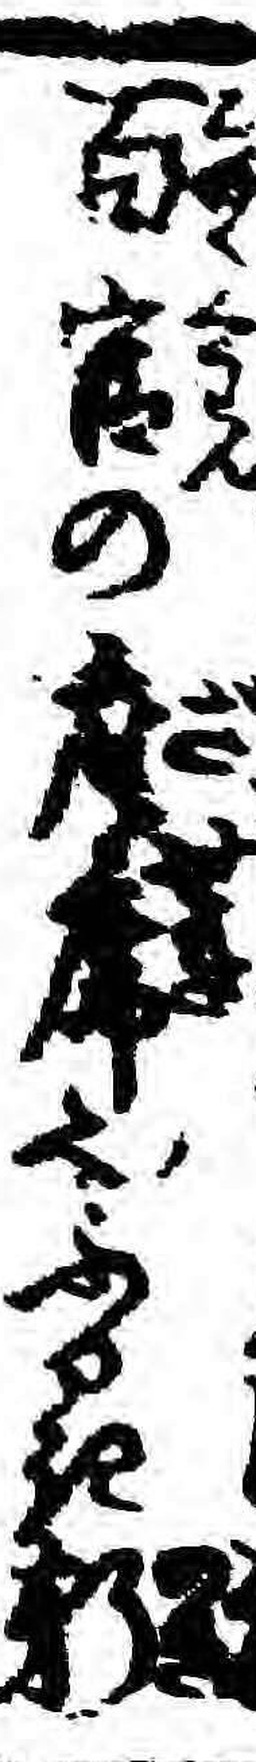百官の座席也ふるき軒
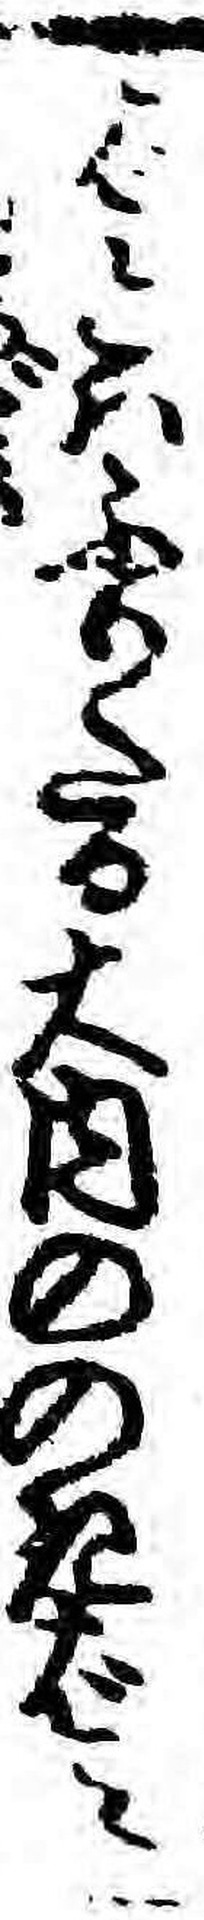ばとはふりたる大内ののきばに
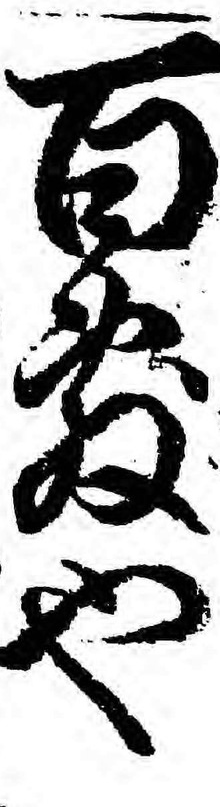百敷や
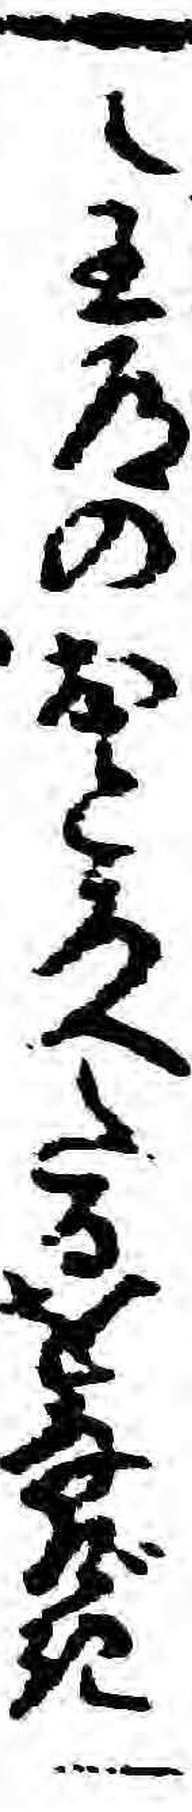て王道のおとろへたるをなげき
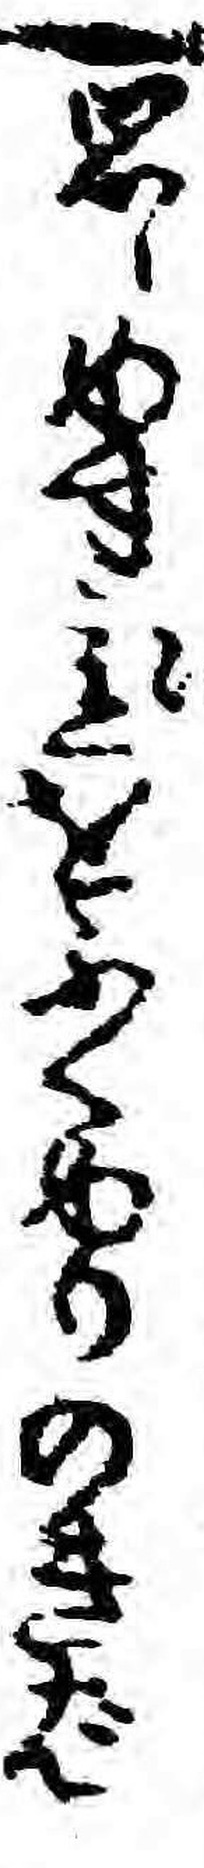思しめす意をふくめりのきば
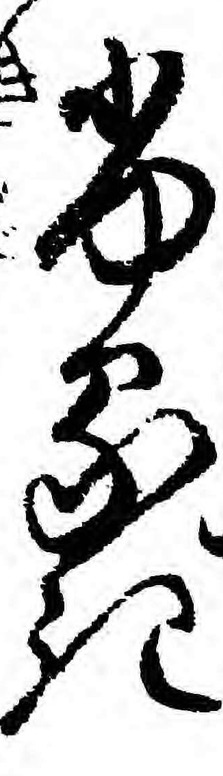ふるき
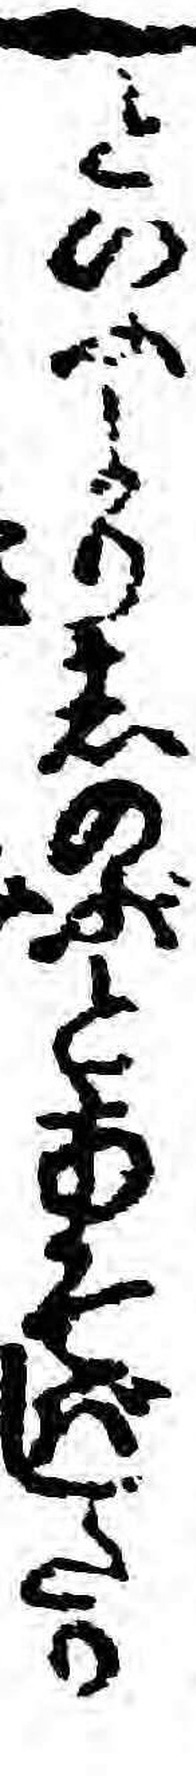といふよりしのぶとあそばしたり
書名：頭書和歌注譯／壽賀多百人一首小倉錦
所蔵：国文学研究資料館
